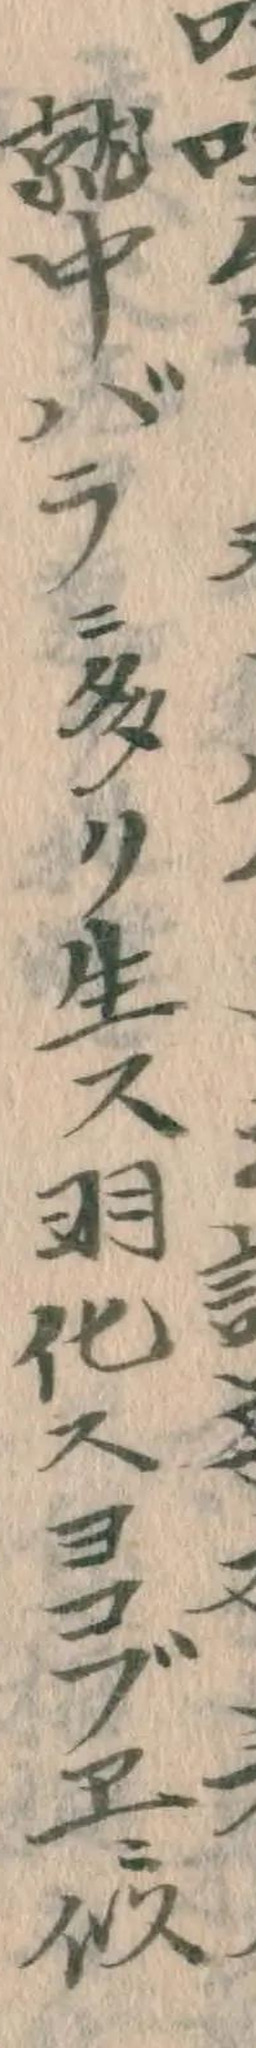就中バラニ多ク生ス羽化スヨコブヱニ似
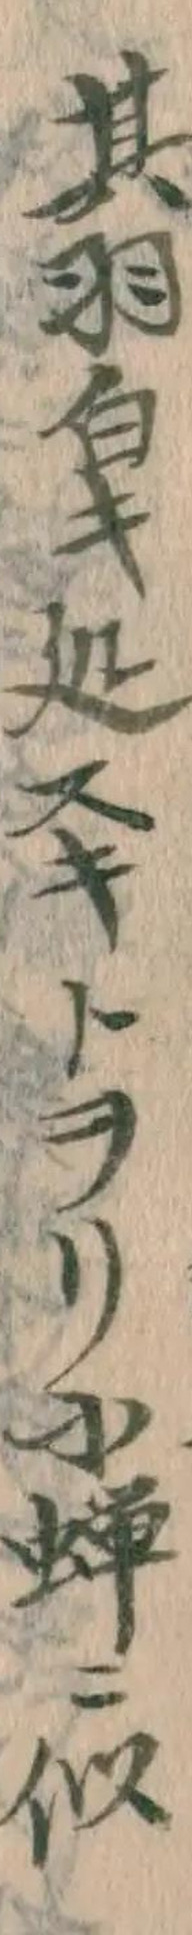其羽白キ処スキトヲリ小蝉ニ似
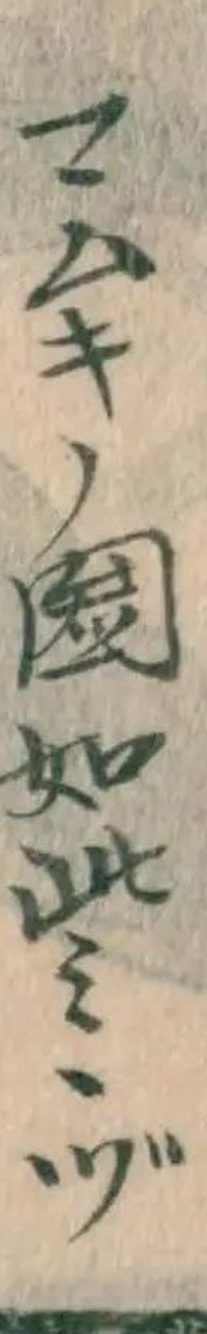マムキノ圖如此ミヽヅ
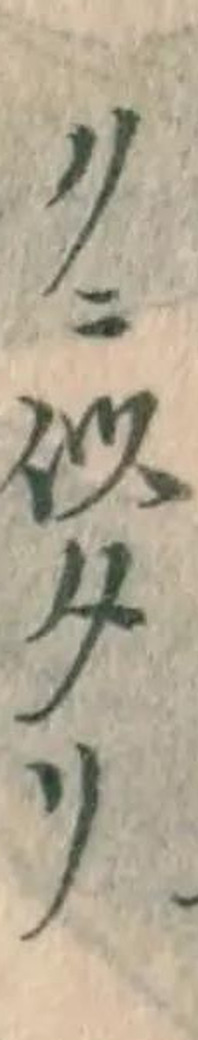クニ似タリ
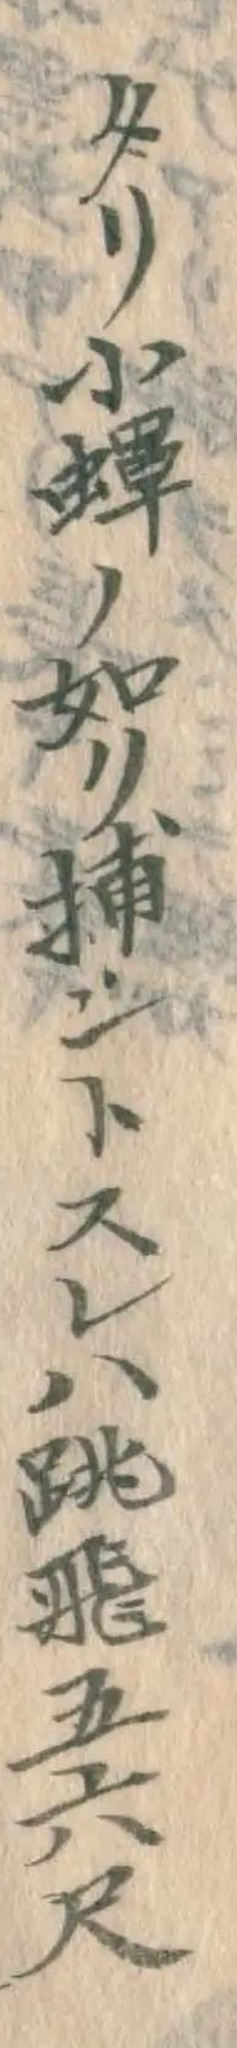タリ小蝉ノ如ク捕シトスレハ跳飛五六尺
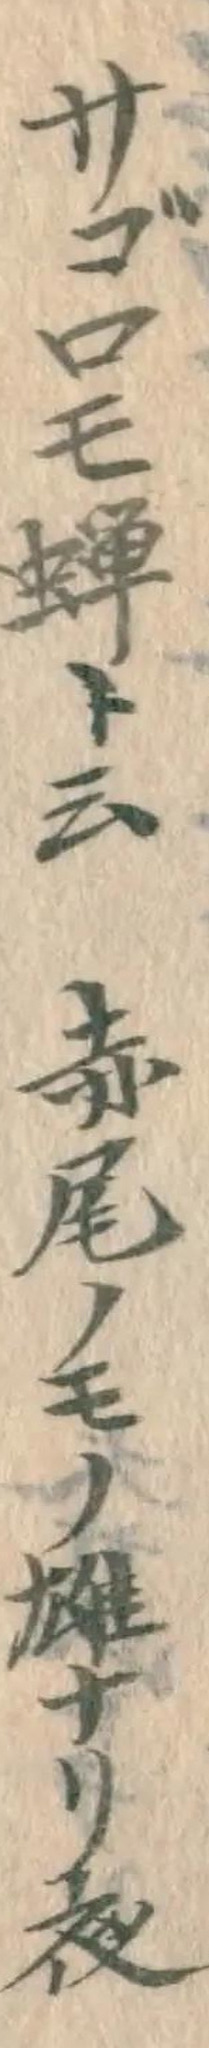サゴロモ蝉ト云赤尾ノモノ雄ナリ夜
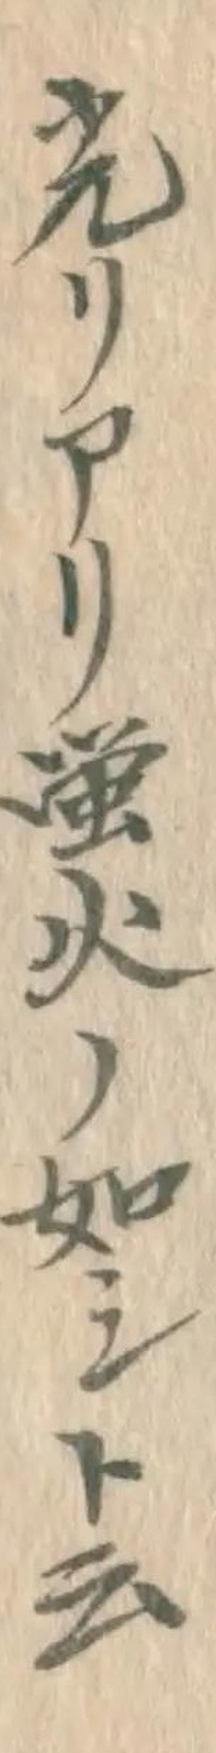光リアリ蛍火ノ如シト云

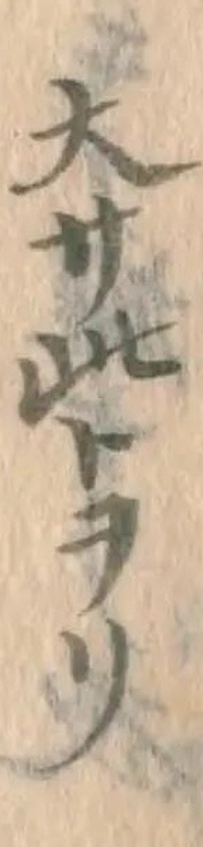大サ此トヲリ
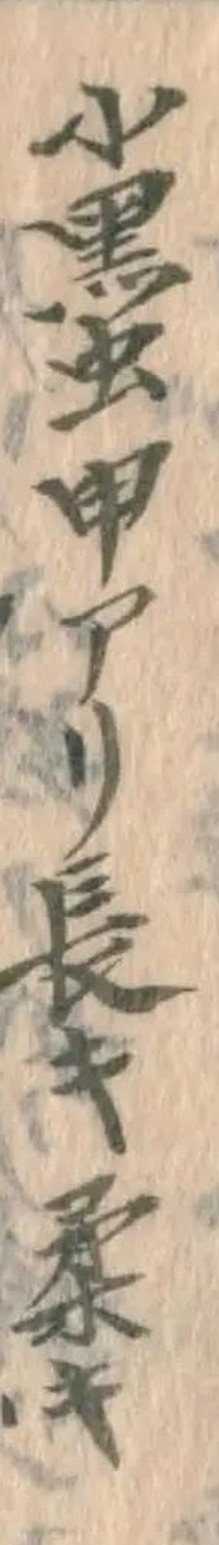小黒虫甲アリ長キ柔キ
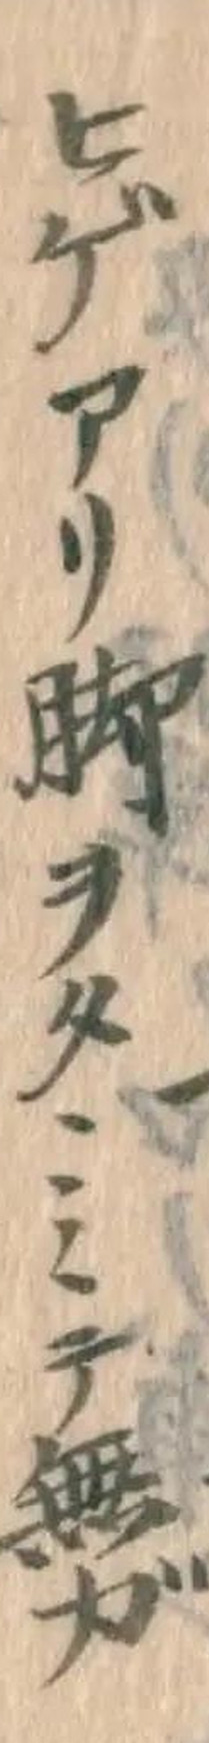ヒゲアリ脚ヲタヽミテ無ガ
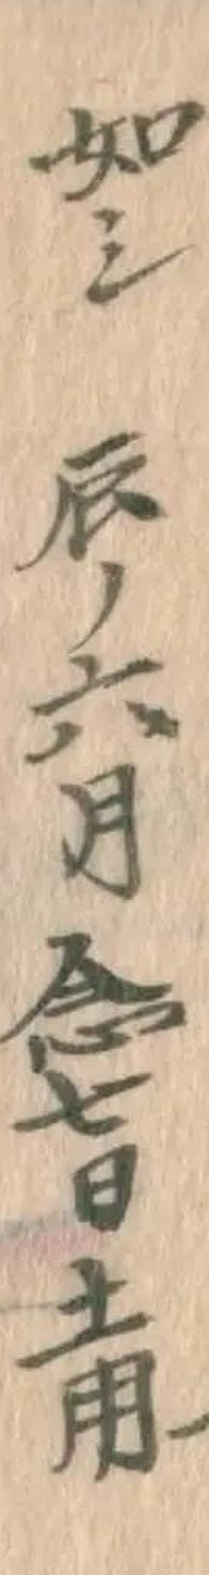如シ辰ノ六月念七日土用
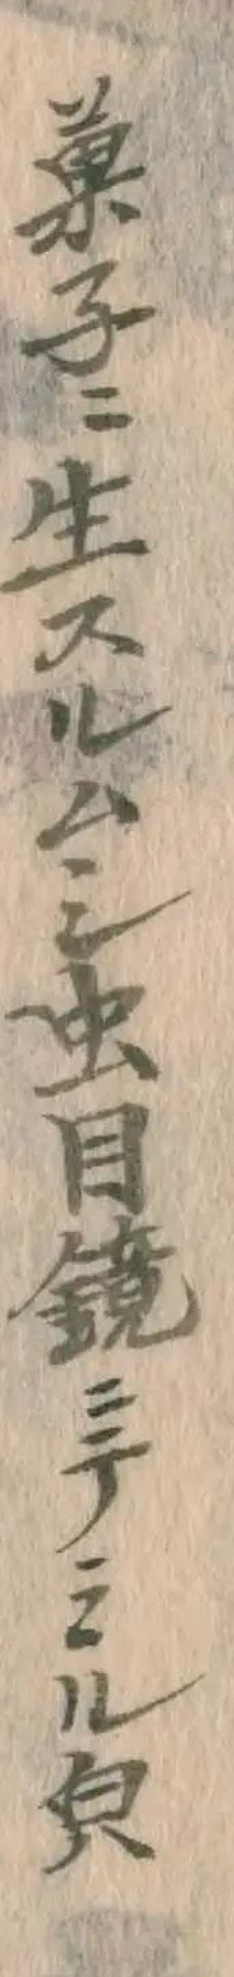菓子ニ生スルムシ虫眼鏡ニテミル皃
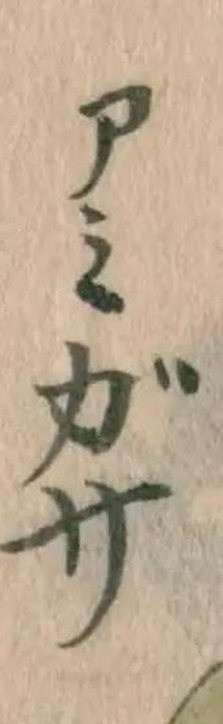アミガサ
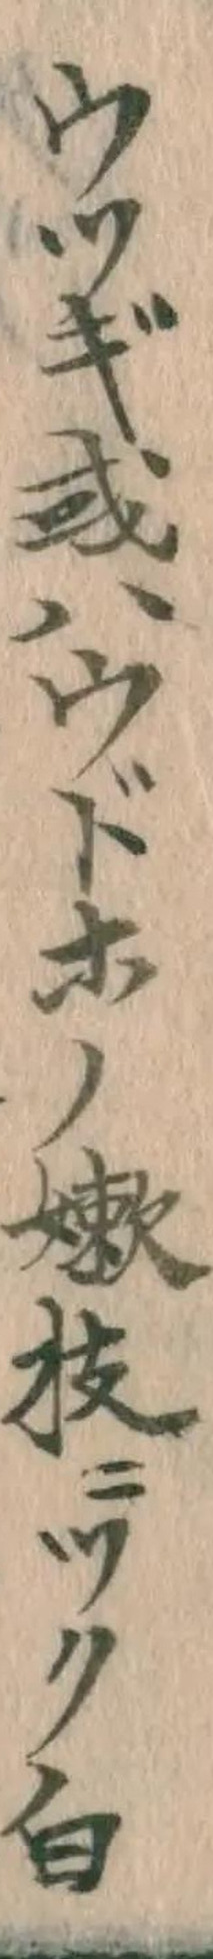ウツギ或ハウド等ノ嫩枝ニツク白
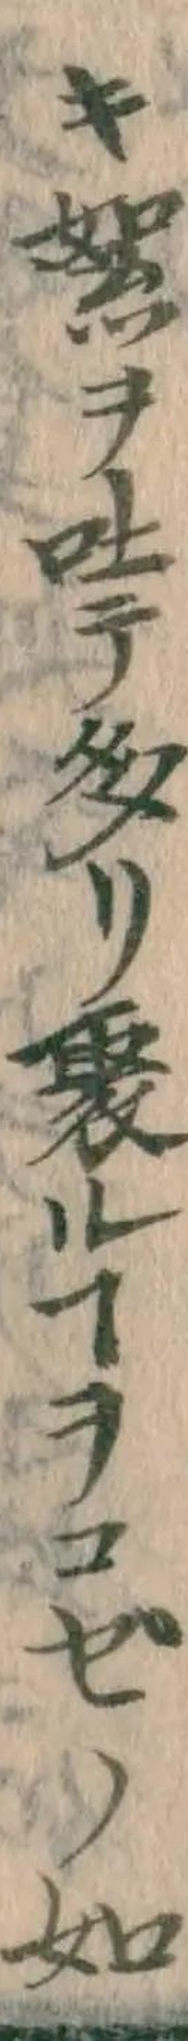キ絮ヲ吐テ多ク聚ルコトヲコゼノ如
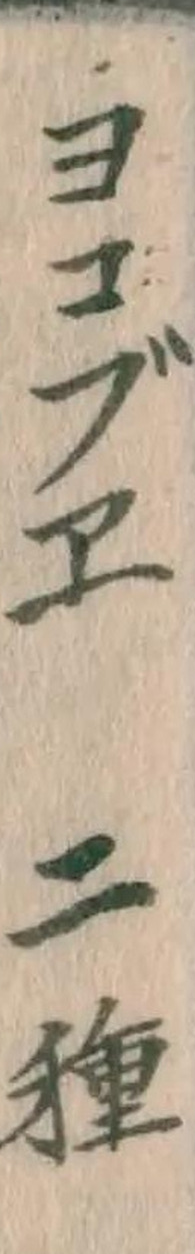ヨコブヱ二種
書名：千蟲譜 3巻. [3]
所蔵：国立国会図書館 National Diet Library, JAPAN
